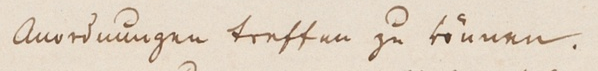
Anordnungen treffen zu können.
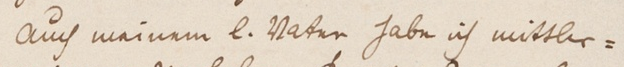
Auch meinem l. Vater habe ich mittler-
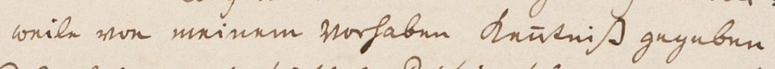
weile von meinem Vorhaben Kenntniß gegeben
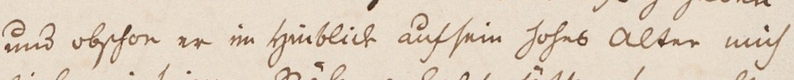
und obschon er im Hinblick auf sein hohes Alter mich
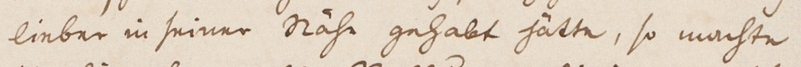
lieber in seiner Nähe gehabt hätte, so machte
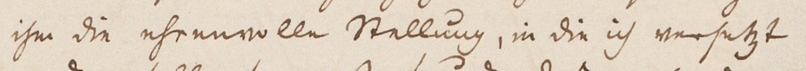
ihm die ehrenvolle Stellung, in die ich versetzt
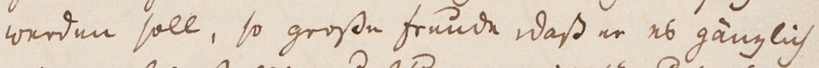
werden soll, so große Freude, daß er es gänzlich
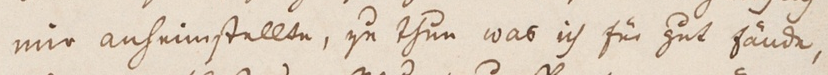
mir anheimstellte, zu thun was ich für gut fände,
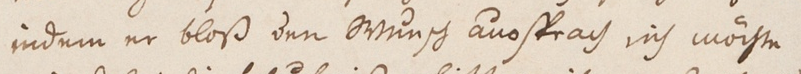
indem er bloß den Wunsch aussprach, ich möchte
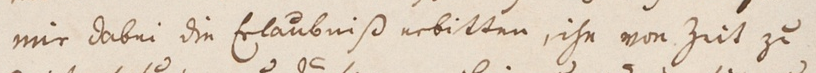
mir dabei die Erlaubniß erbitten, ihn von Zeit zu
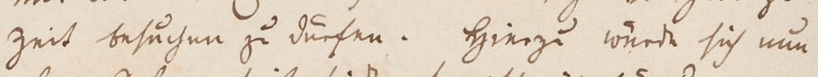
Zeit besuchen zu dürfen. Hierzu würde sich nun
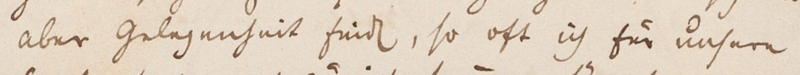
aber Gelegenheit finden, so oft ich für unsere
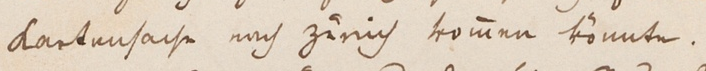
Kartensache nach Zürich kommen könnte.
